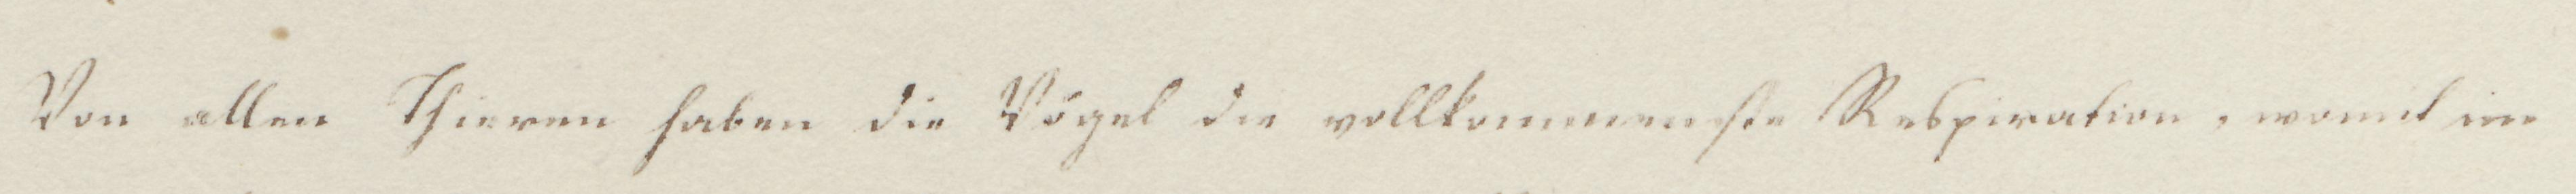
Von allen Thieren haben die Vögel die vollkommenste Respiration, womit im
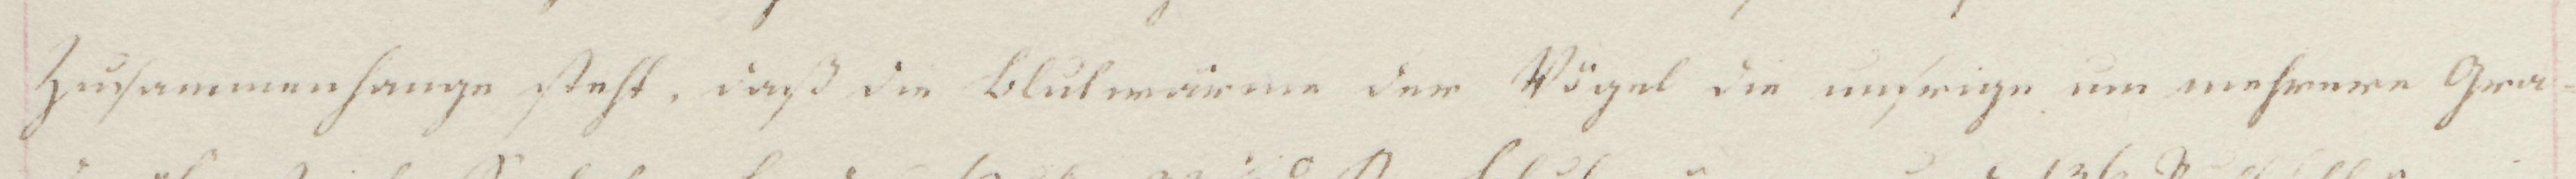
Zusammenhange steht, daß die Blutwärme der Vögel die unsrige um mehrere Gra-
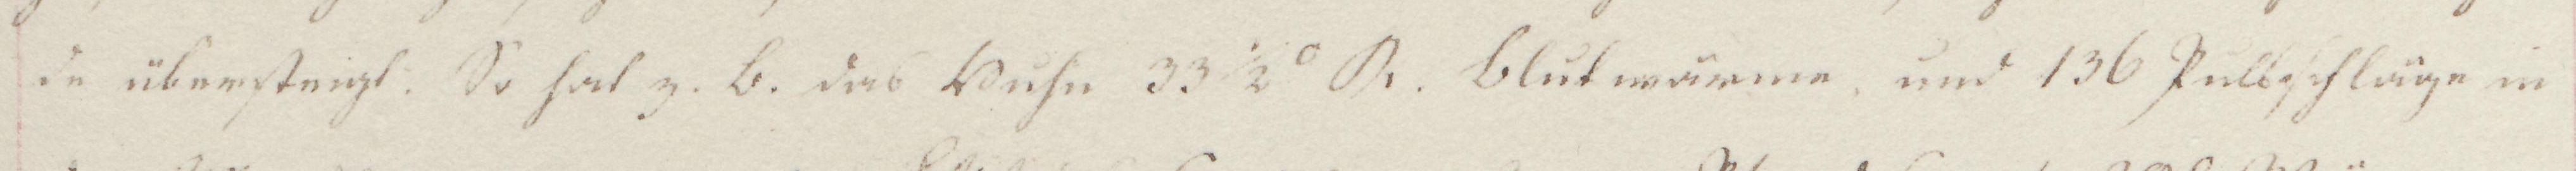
de übersteigt. So hat z. B. das Huhn 33½° R. Blutwärme und 136 Pulsschläge in
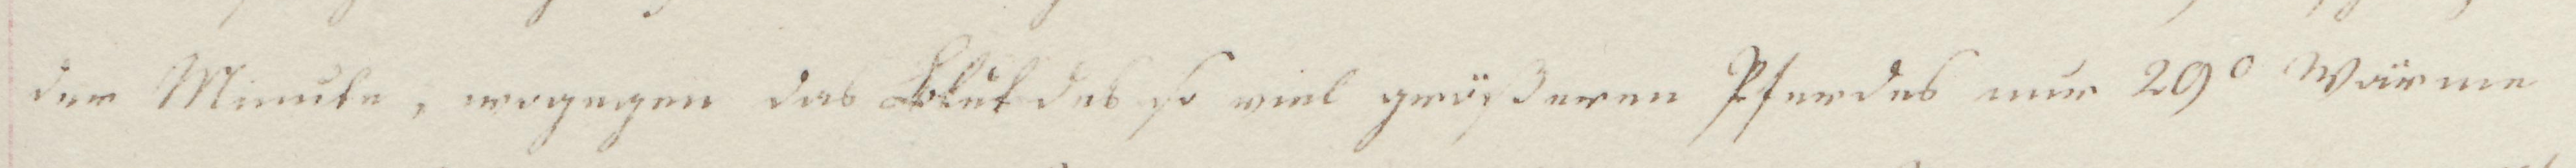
der Minute, wogegen das Blut des viel größeren Pferdes nur 29° Wärme
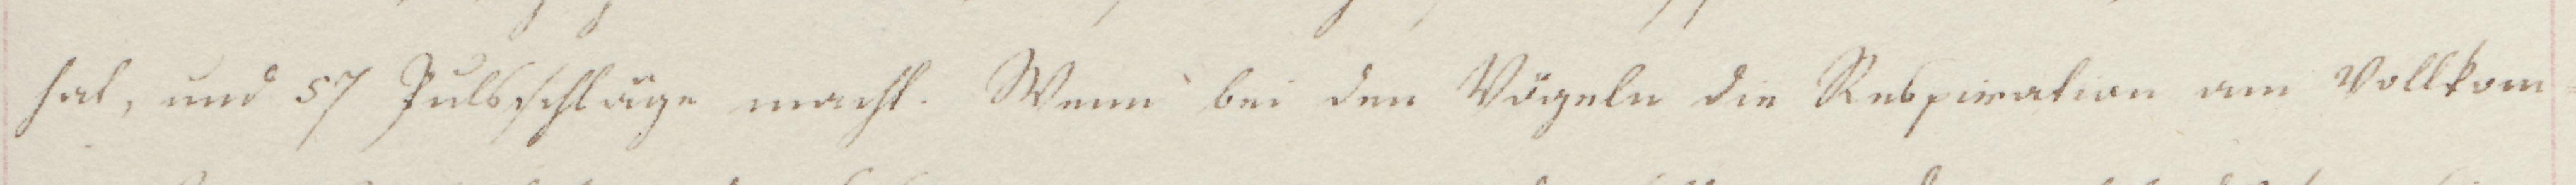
hat, und 57 Pulsschläge macht. Wenn bei den Vögeln die Respiration am Vollkom-
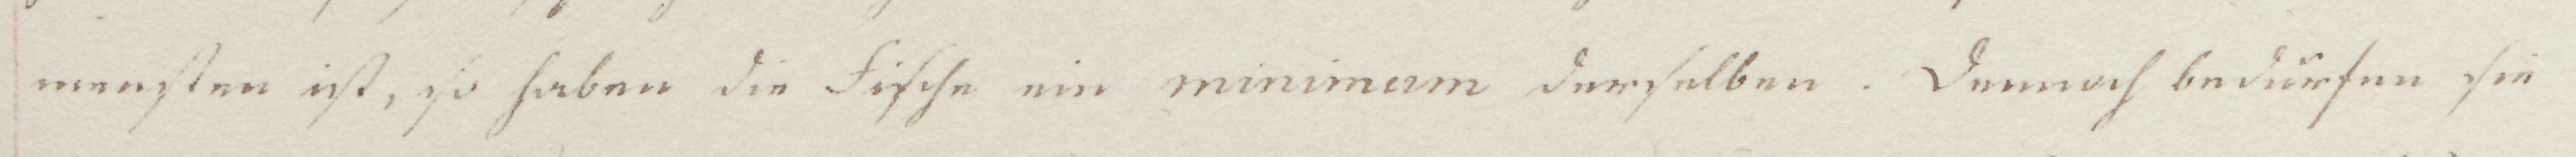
mensten ist, so haben die Fische ein minimum derselben. Dennoch bedürfen sie
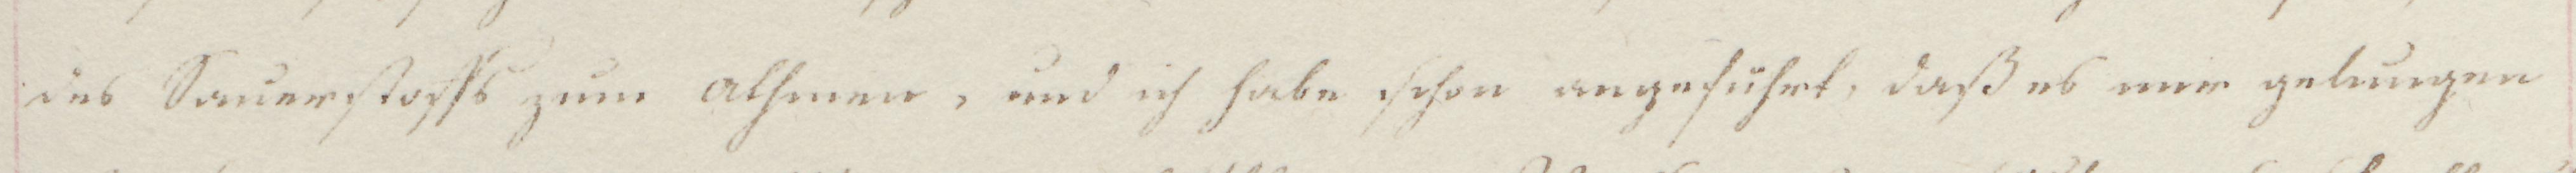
des Sauerstoffs zum athmen, und ich habe schon angeführt, daß es mir gelungen
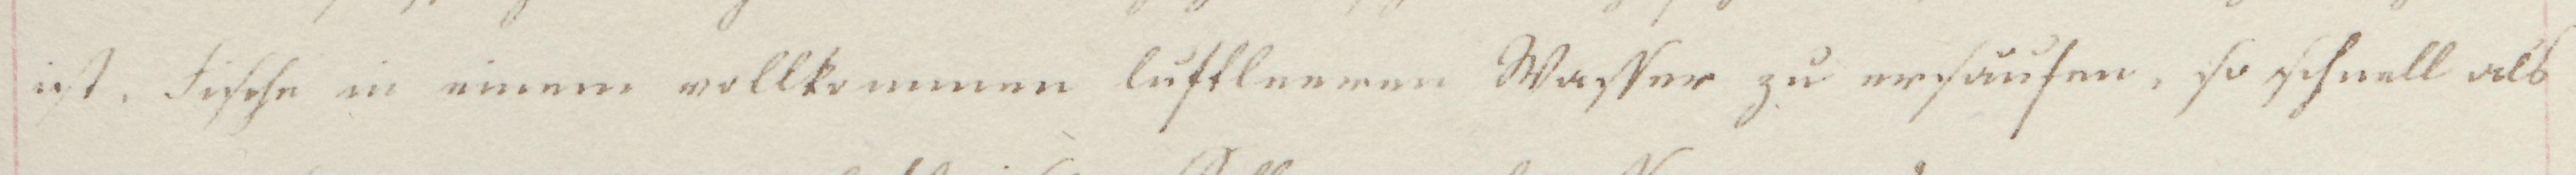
ist, Fische in einem vollkommen luftleeren Wasser zu ersäufen, so schnell als
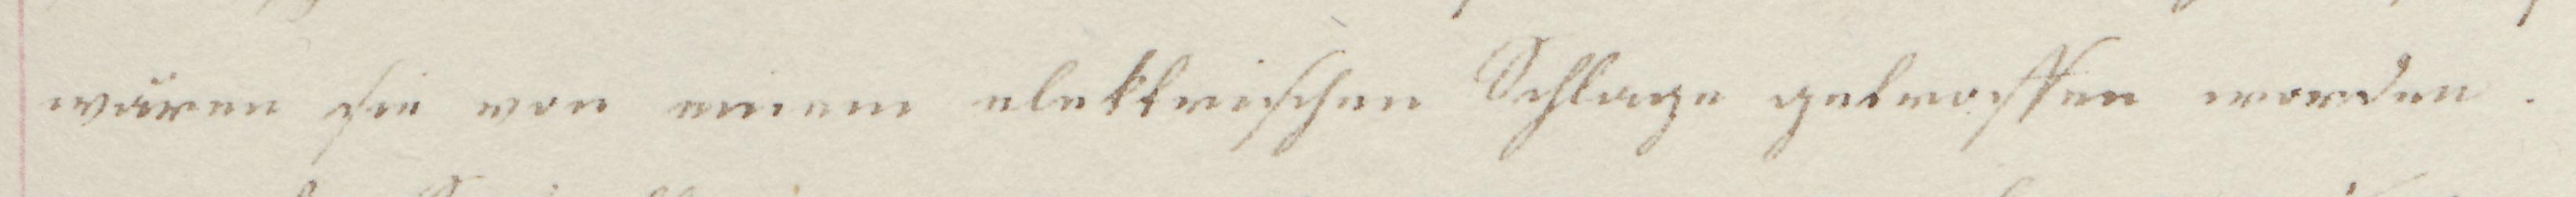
wären sie von einem elektrischen Schlage getroffen worden.
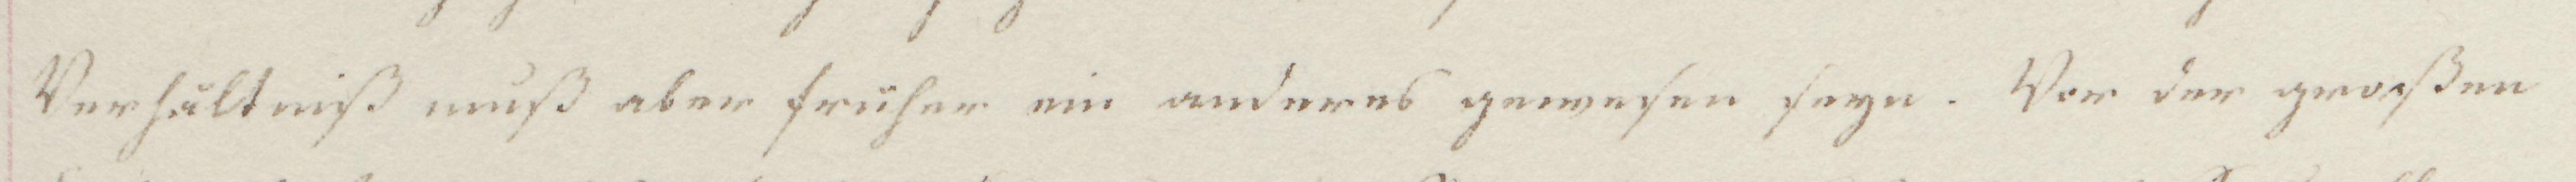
Verhältniß muß aber früher ein anderes gewesen seyn. Vor der großen
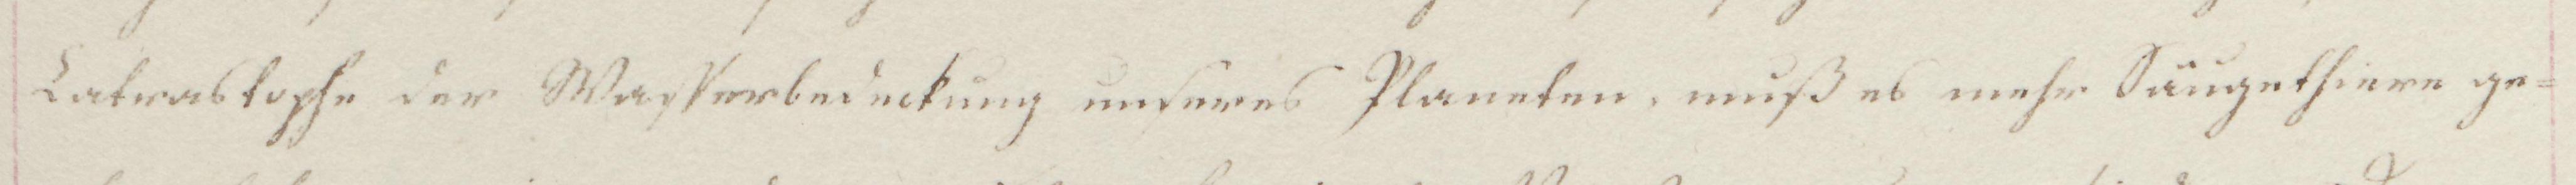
Catastrophe der Wasserbedeckung unseres Planeten, muß es mehr Säugethiere ge-
